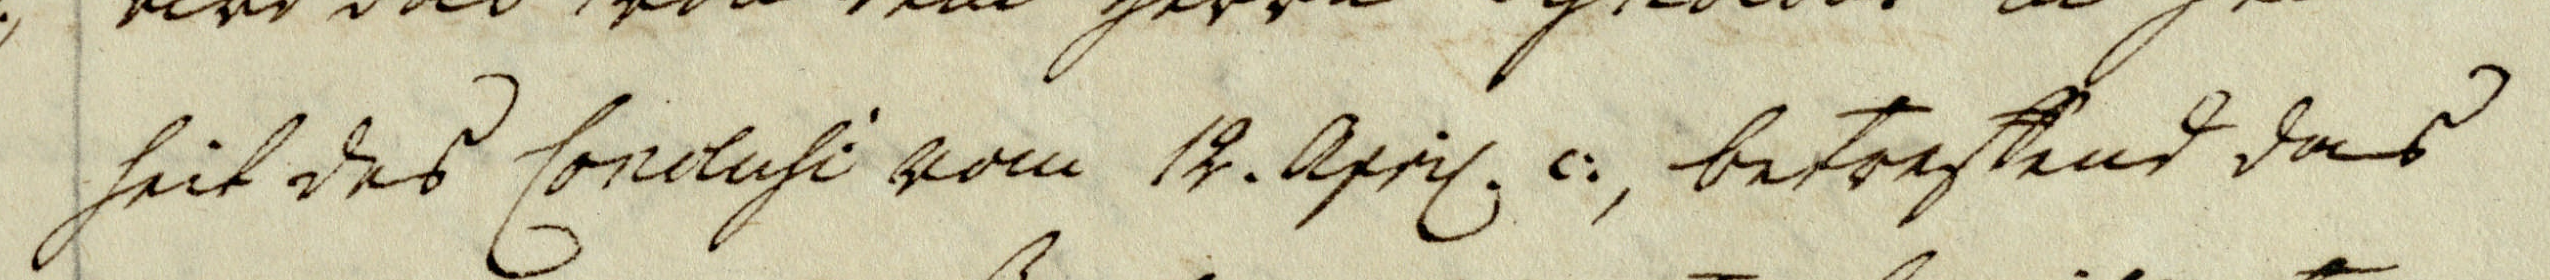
heit des Conclusi vom 12. April. c., betreffend das
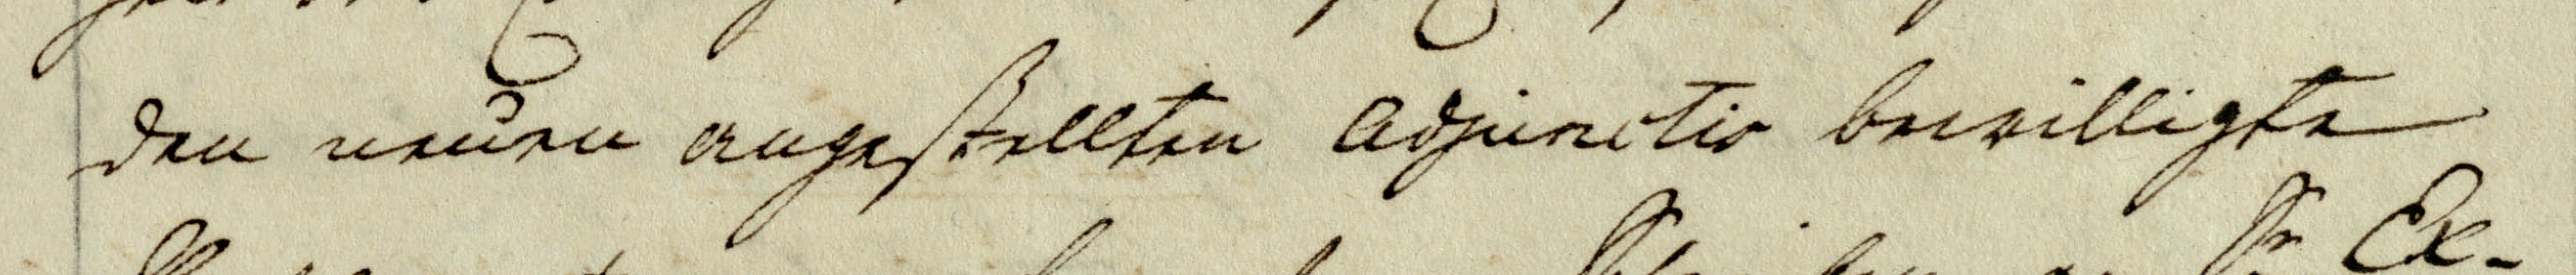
den neuen angestellten Adjunctis bewilligte
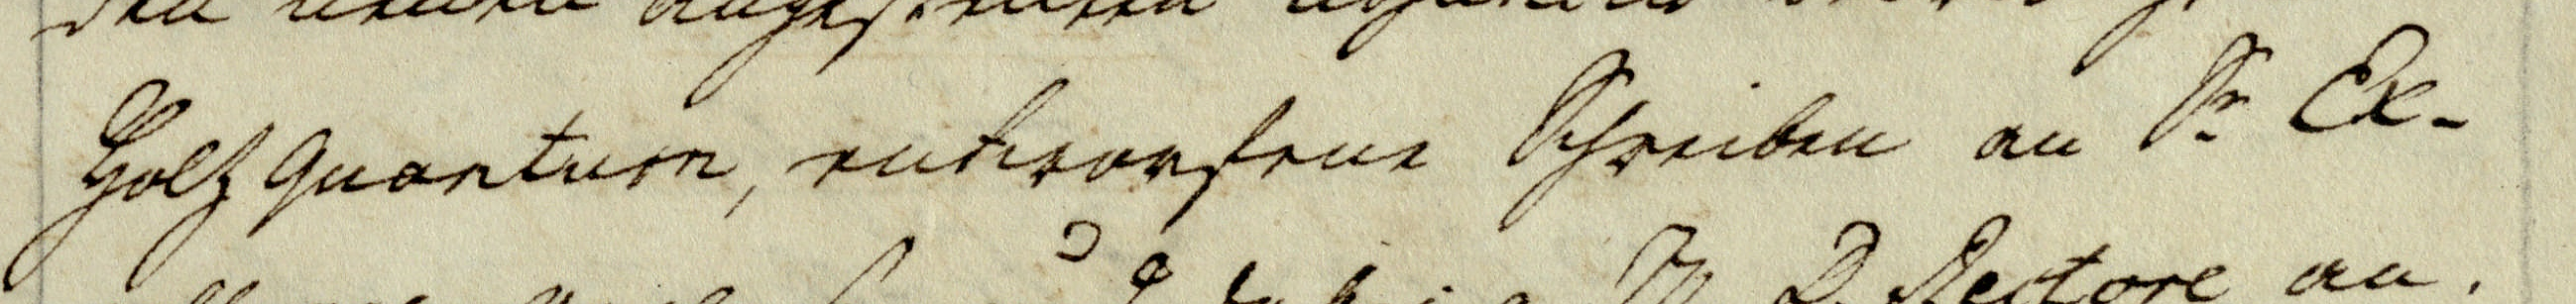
Holz Quantum, entworfene Schreiben an Sr Ex¬
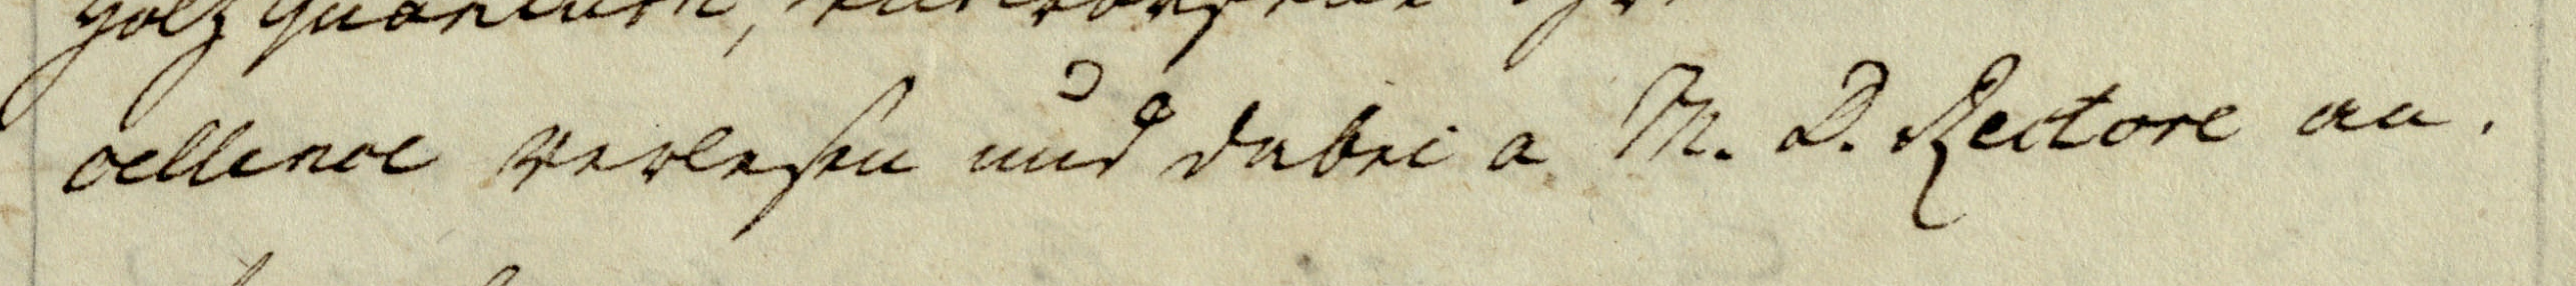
cellence verlesen und dabei a M. D. Rectore an¬
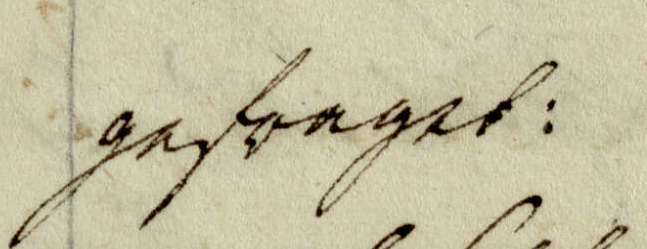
gefraget:
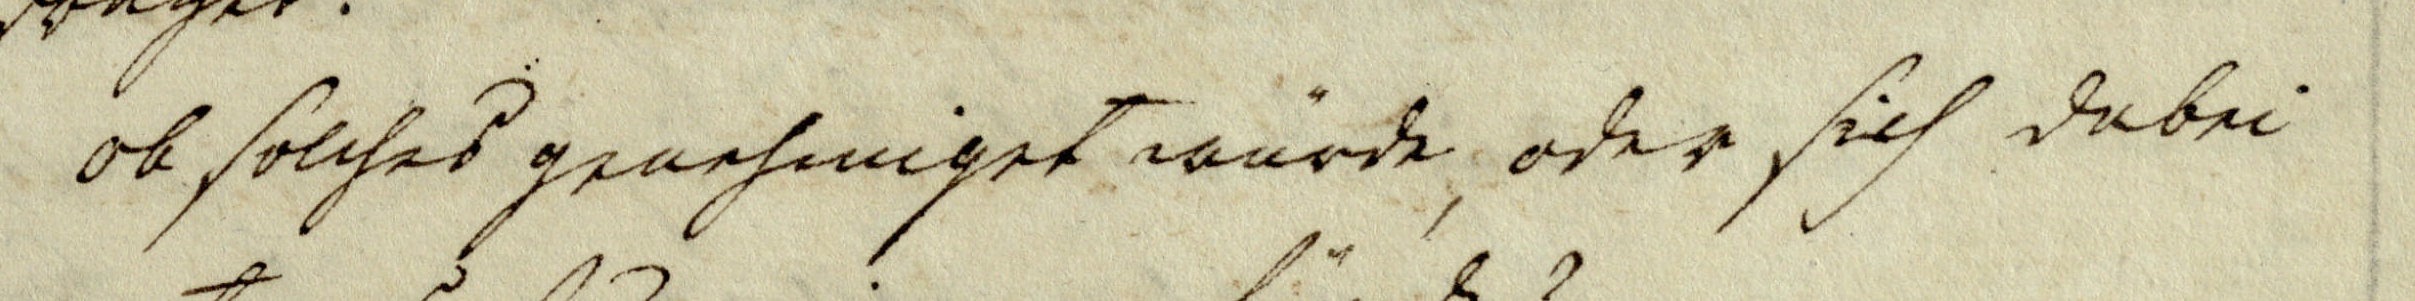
ob solches genehmiget würde, oder sich dabei
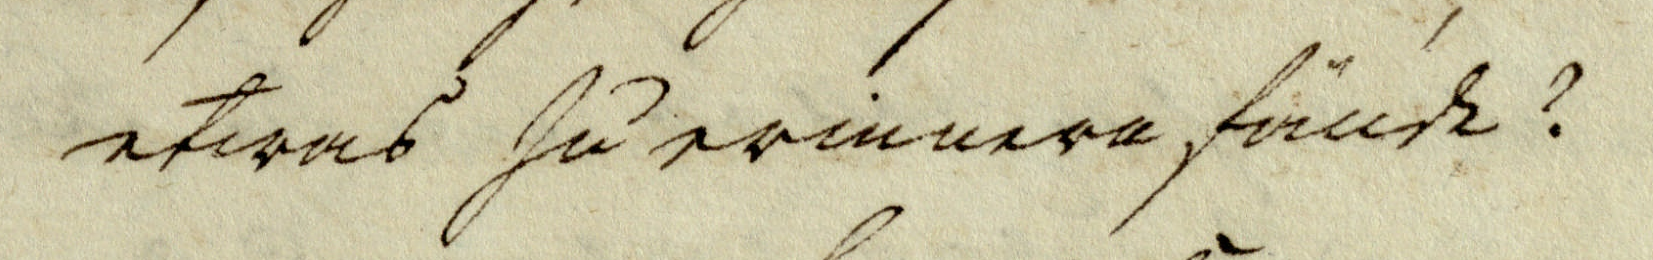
etwas zu erinnern fände?.
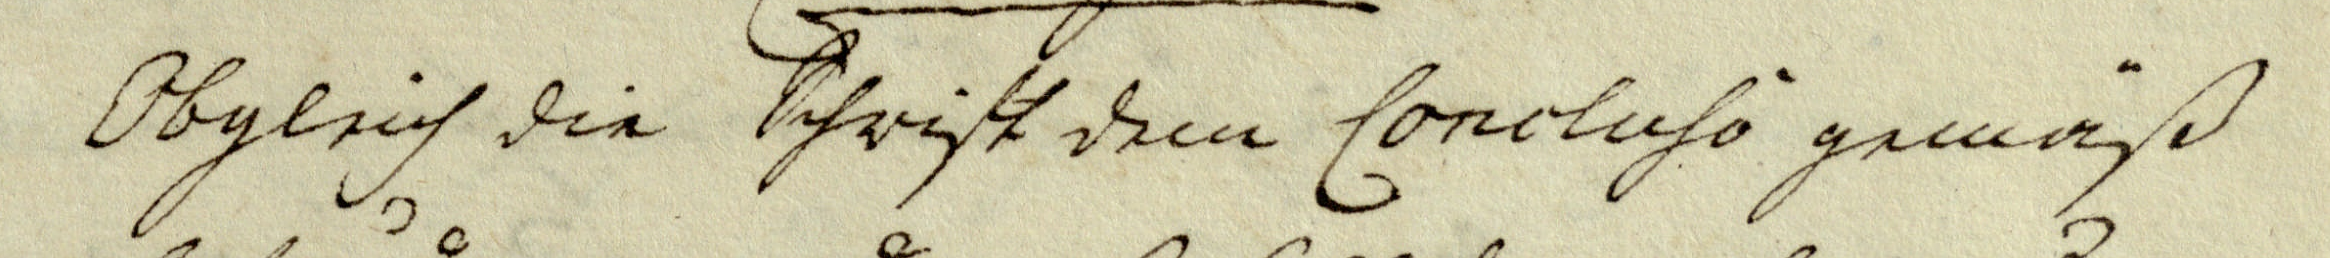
Obgleich die Schrift dem Concluso gemäß
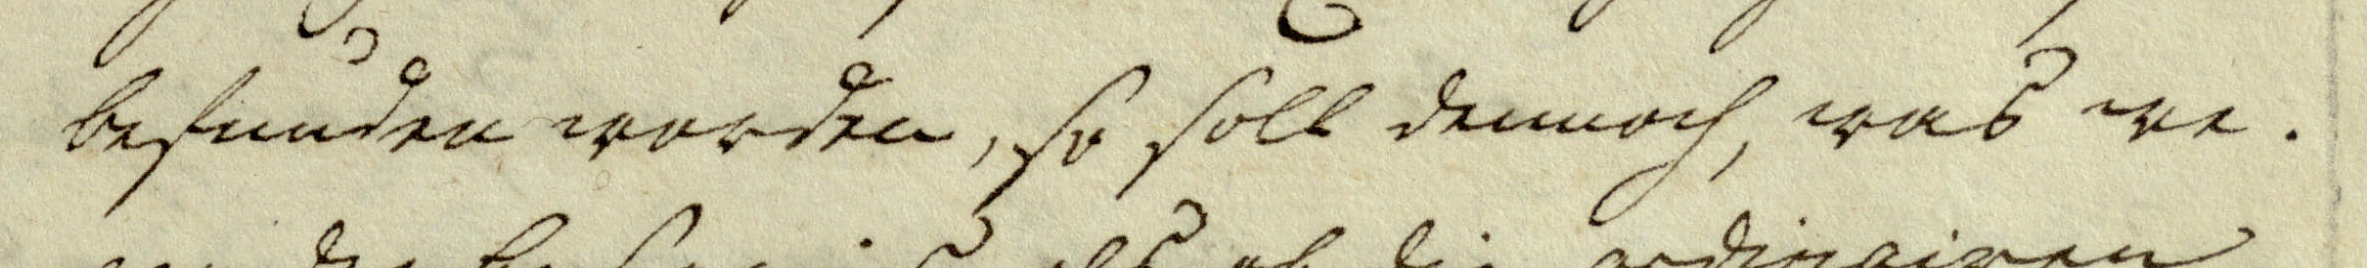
befunden worden, so soll dennoch, was we-
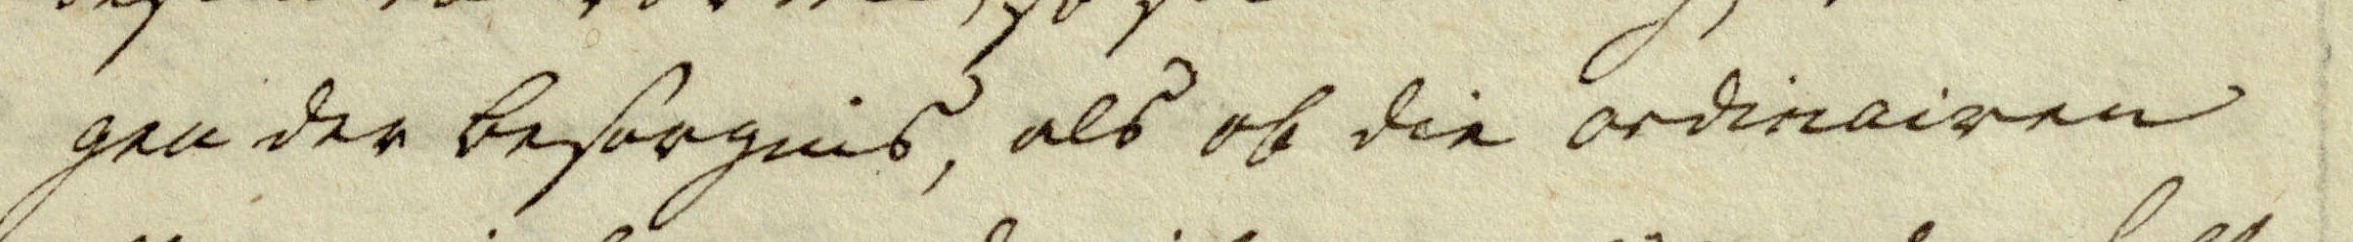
gen der Besorgins, als ob die ordinairen
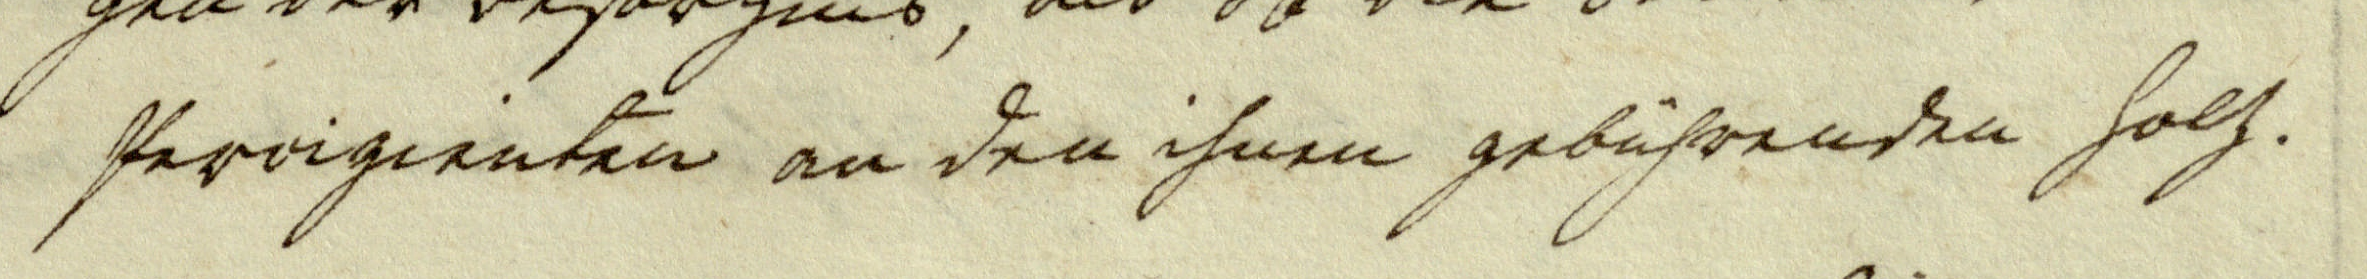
Percipienten an den ihnen gebührenden Holz¬
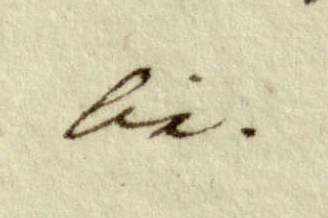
be¬
